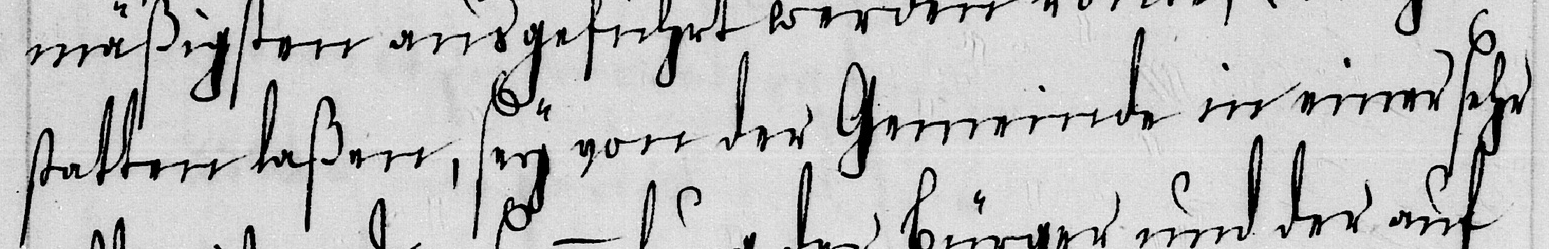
statten laßen, sey von der Gemeinde in einer sehr
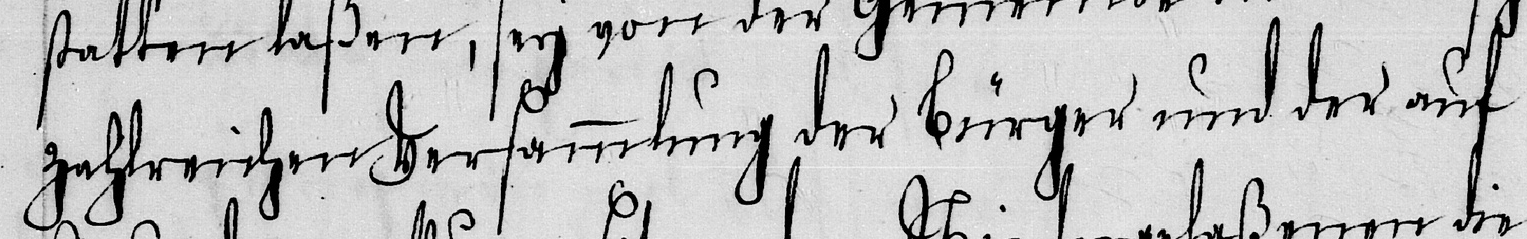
zahlreichen Versammlung der Bürger und der auf
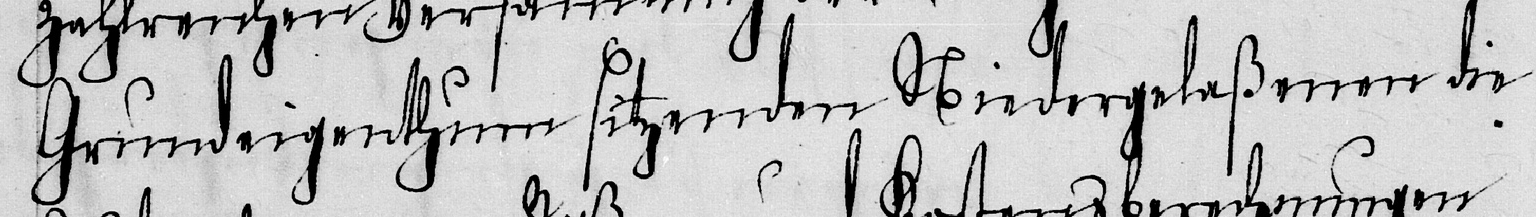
Grundeigenthum sitzenden Niedergelaßenen die
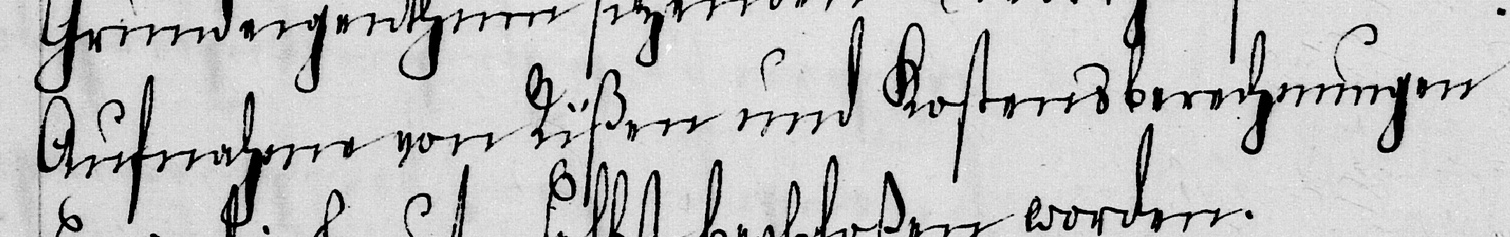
Aufnahme von Rißen und Kostensberechnungen
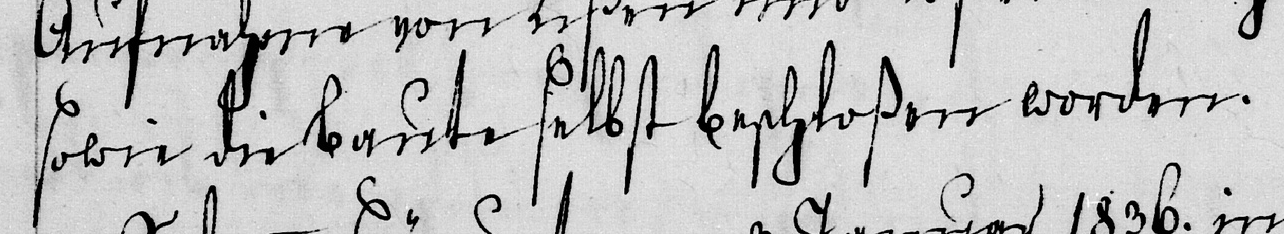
sowie die Baute selbst beschloßen worden.
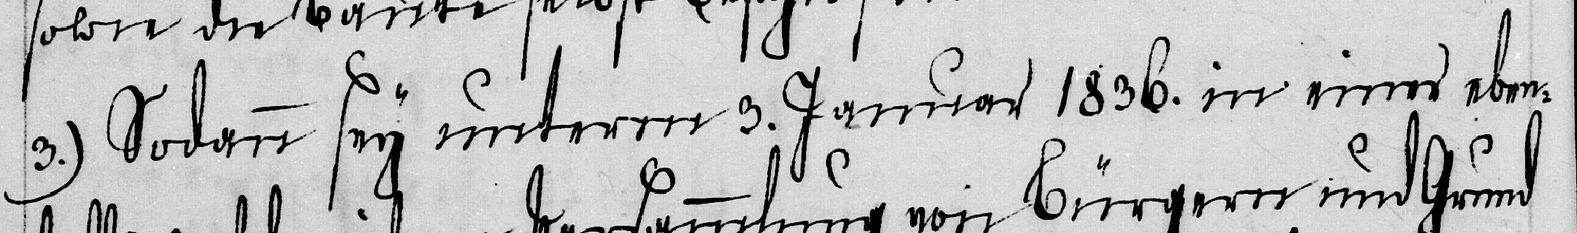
3.) Sodann sey unterm 3. Januar 1836. in einer eben¬
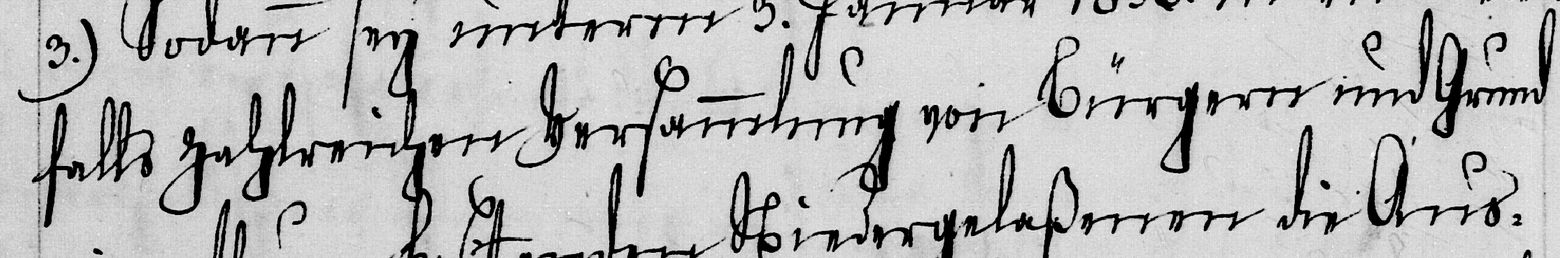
falls zahlreichen Versammlung von Bürgern und Grun¬
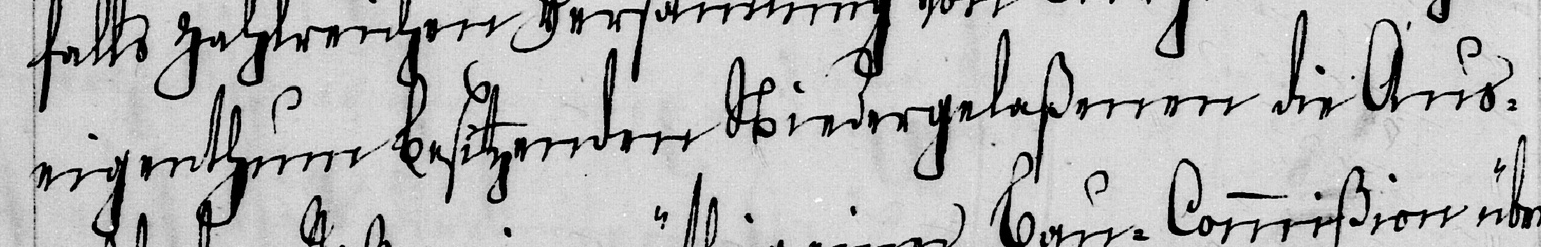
deigenthum besitzenden Niedergelaßenen die Aus¬
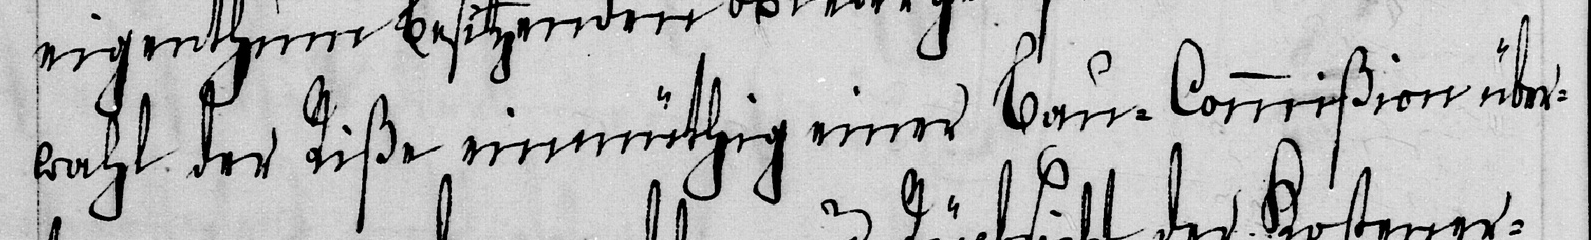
wahl der Riße einmüthig einer Bau-Commißion über¬
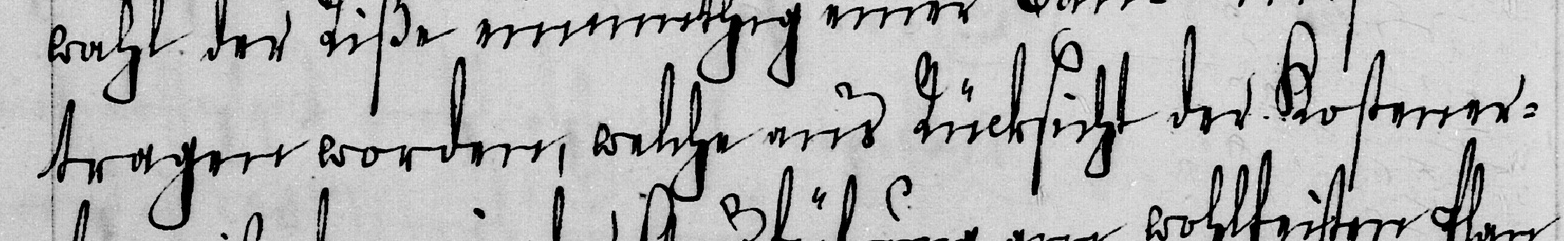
tragen worden, welche aus Rücksicht der Kostener¬
